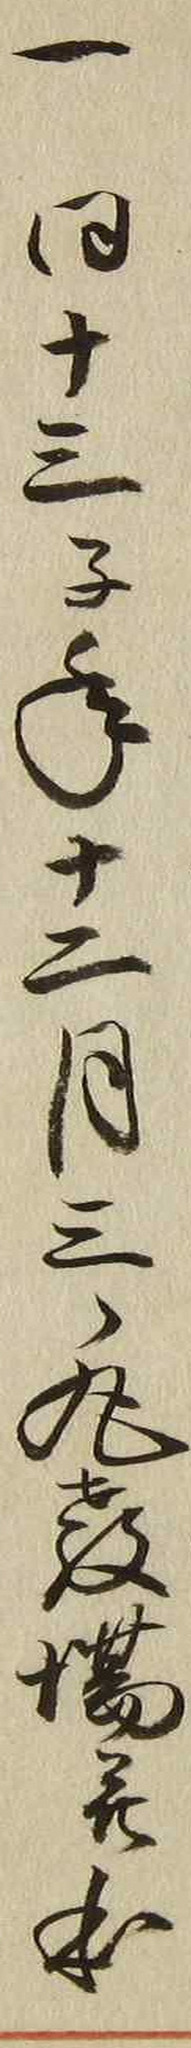一同十三子年十二月三ノ丸教場幷本
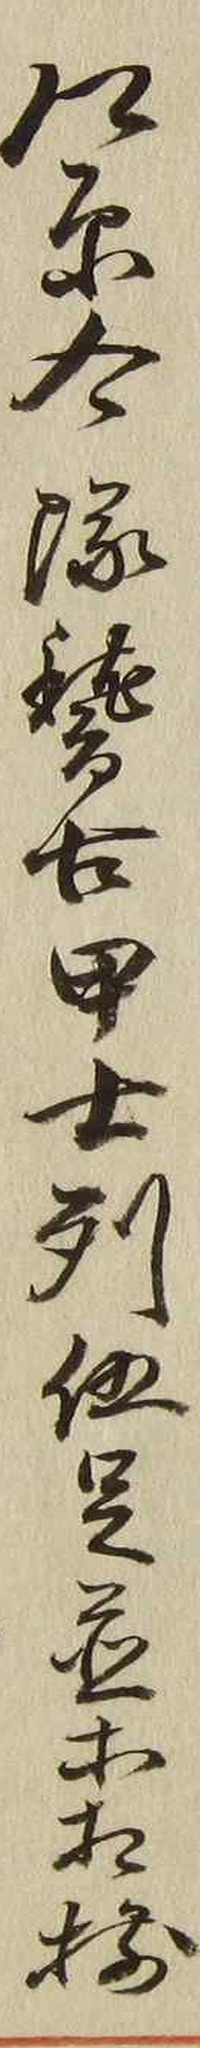郷原合隊稽古甲士列伍足並等相揃
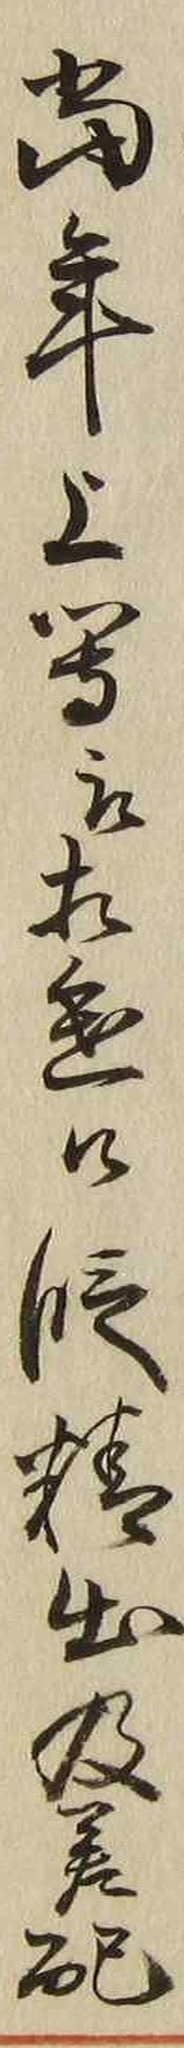当年上等江相進候段精出及差配
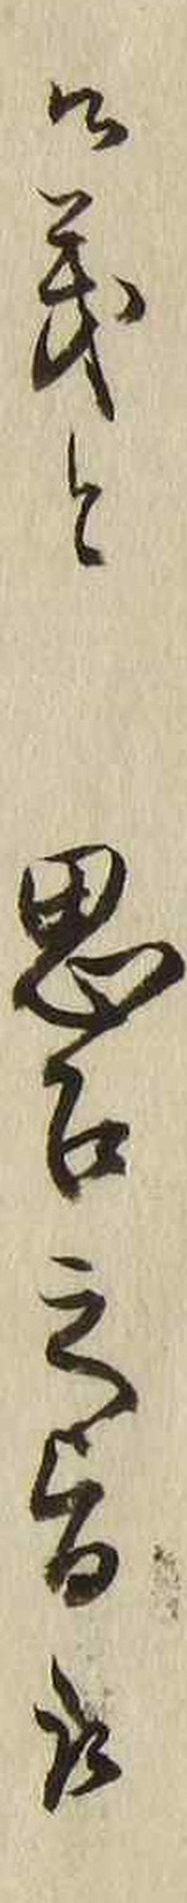候義と思召之旨被
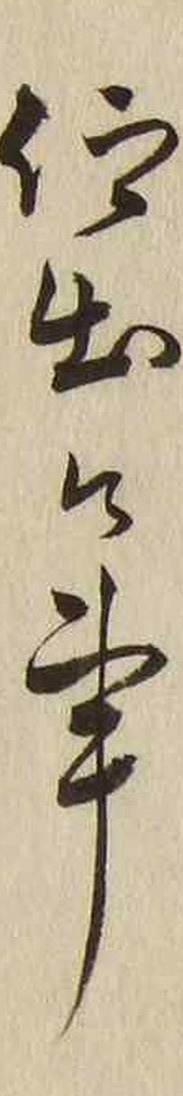仰出候事

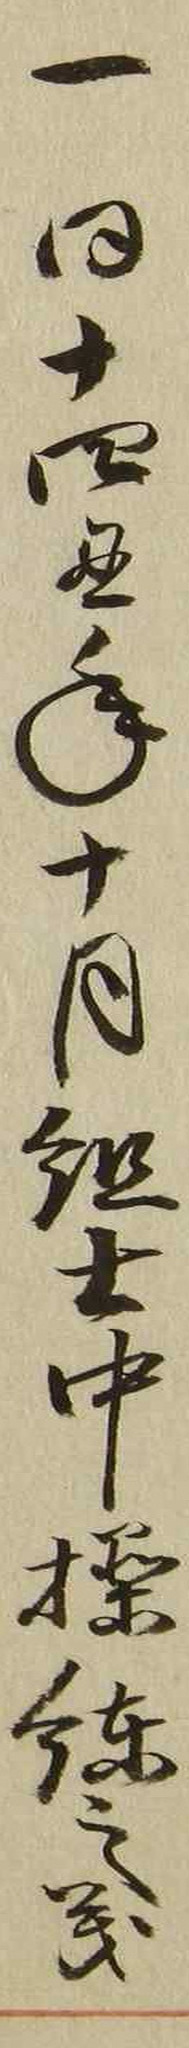一同十四丑年十月組士中操練之義
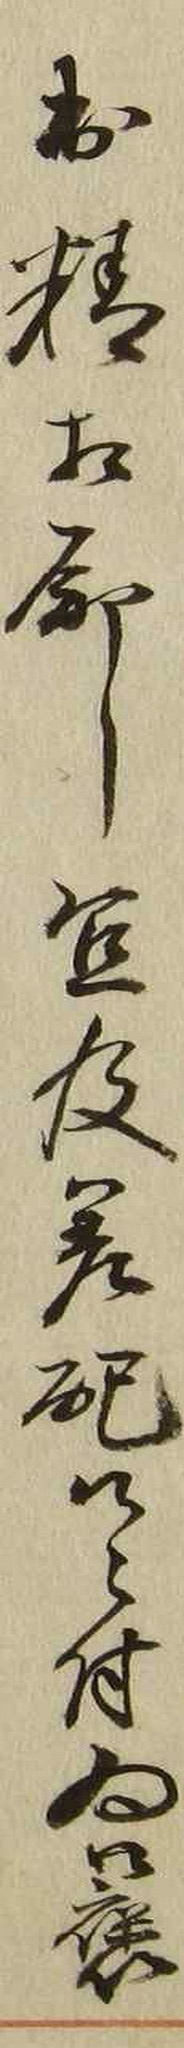出精相励宜及差配候ニ付為御褒
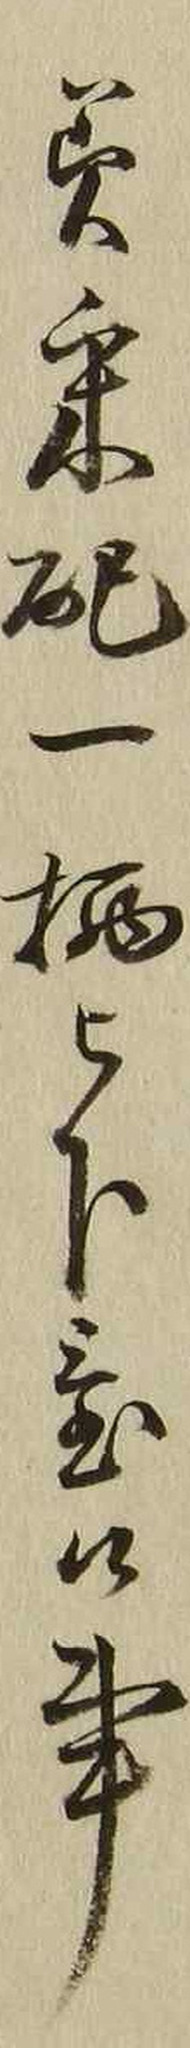美采配一柄被下置候事
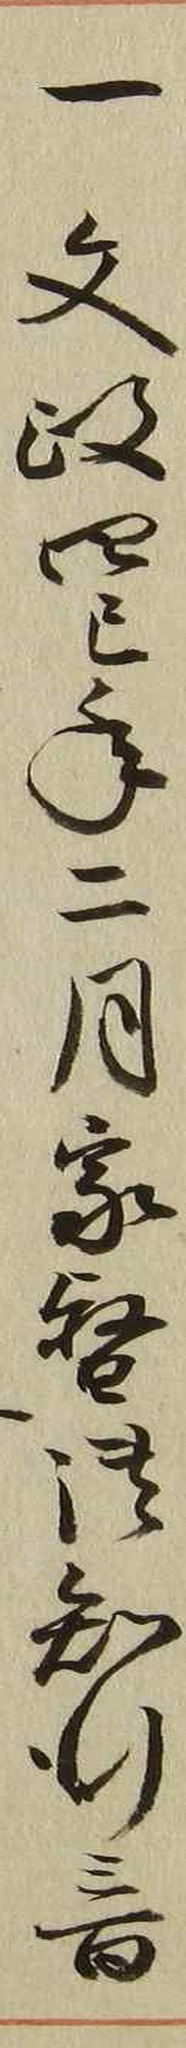一文政四巳年二月家督御知行三百
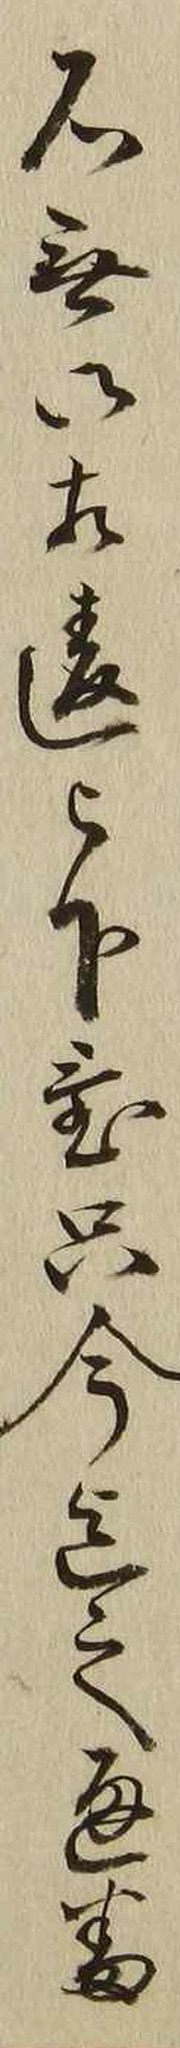石無御相違被下置只今迄之通番
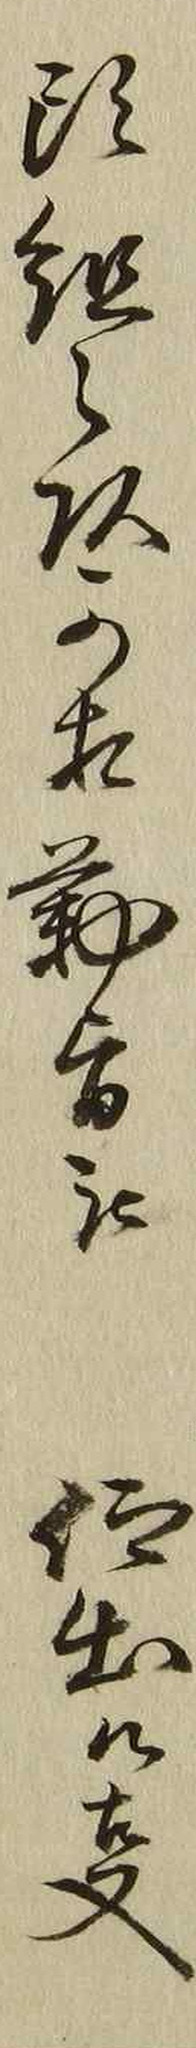頭組之頭可相勤旨被仰出候事
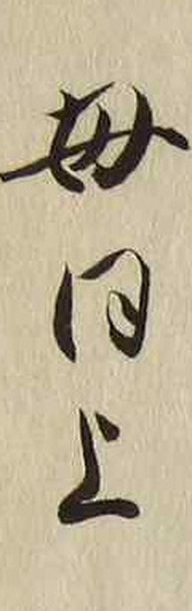母同上

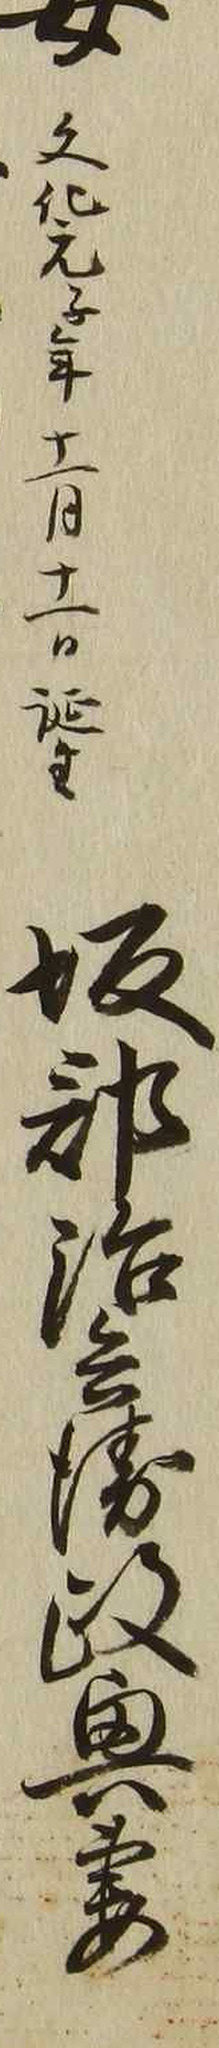女文化元子年十一月十一日誕生坂部治兵衛政興妻
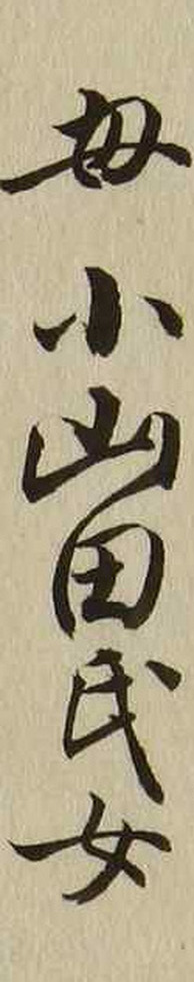母小山田氏女
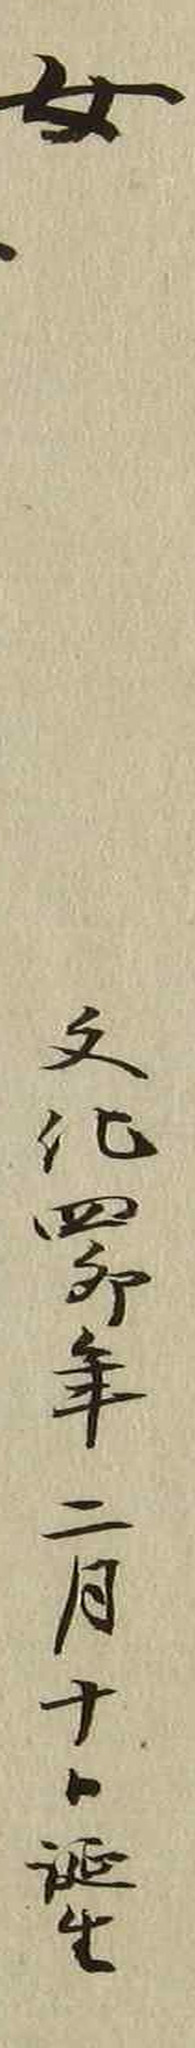女文化四卯年二月十日誕生
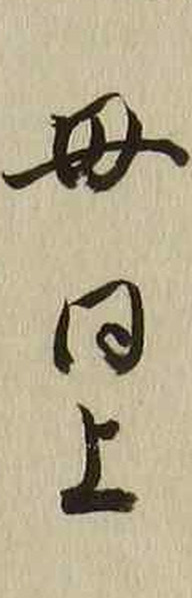母同上
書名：諸士系譜　巻之60　と之部3
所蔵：会津若松市立会津図書館
